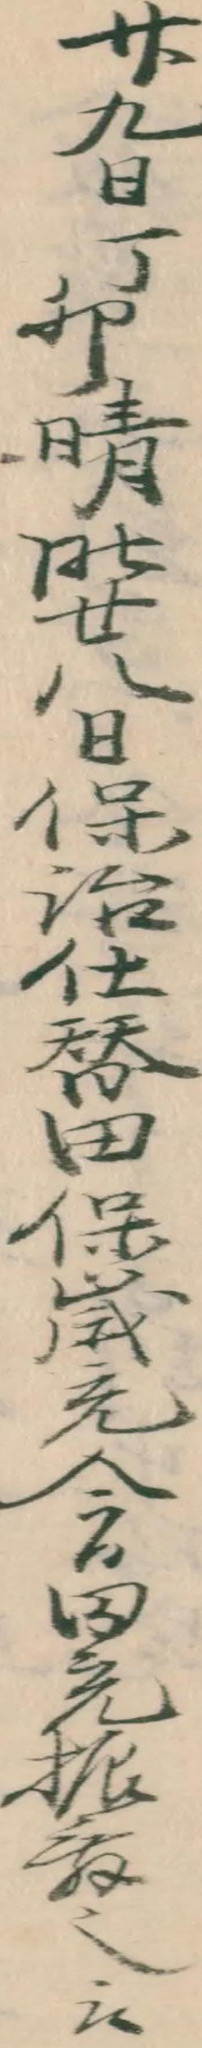廿九日丁卯晴昨廿八日保治仕替田保歳元今日田充振舞也被
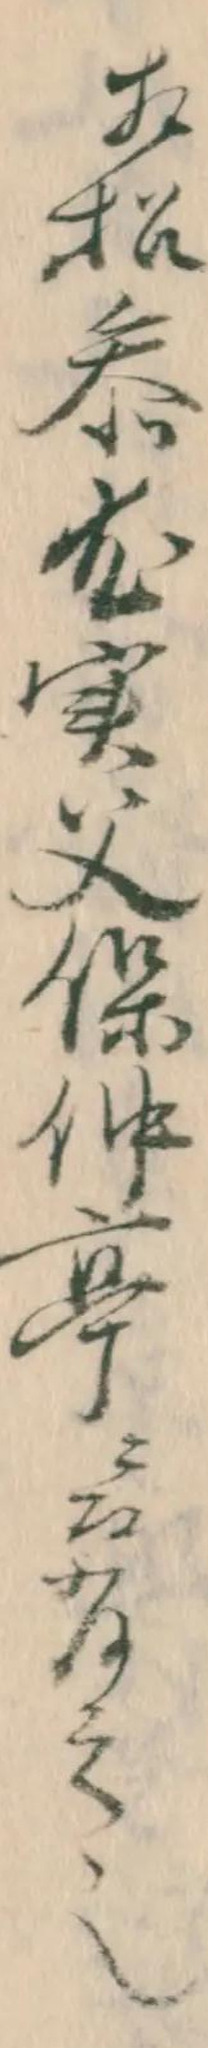相招参尤実父保仲亭に而有之也
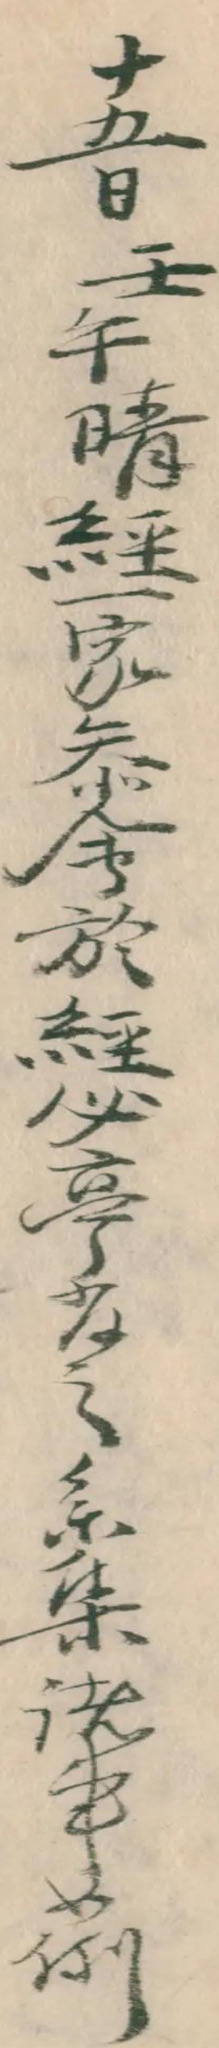十五日壬午晴経一家参會於経必亭有之参集諸事如例
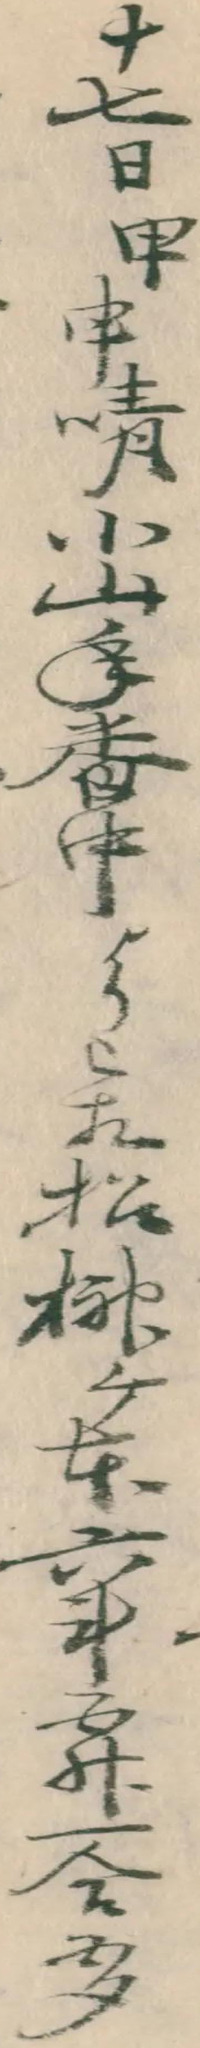十七日甲申晴小山年番中より被相招榊ケ東六斗五升一合五夕
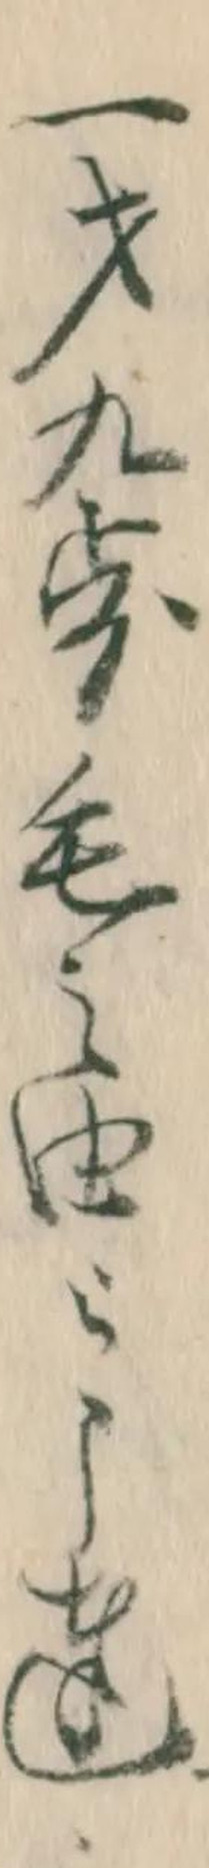一才九歩毛之由被申達也
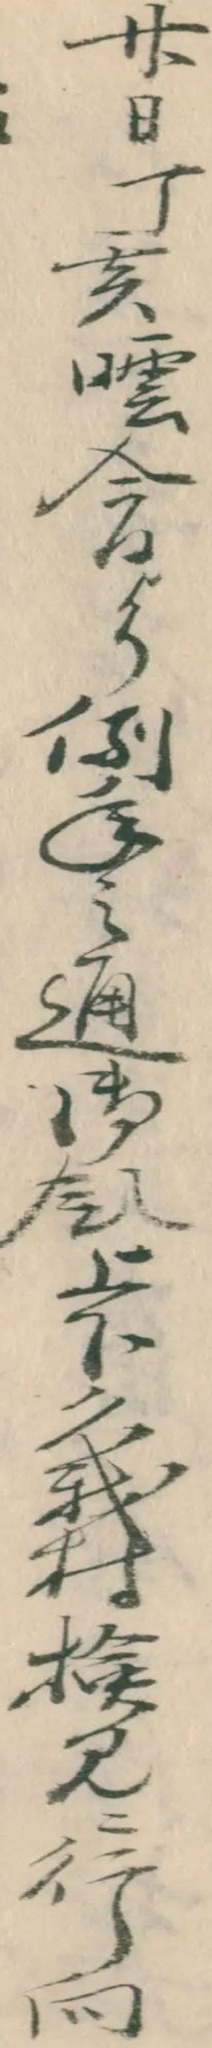廿日丁亥曇今日より例年之通御領上下久我村検見ニ行向
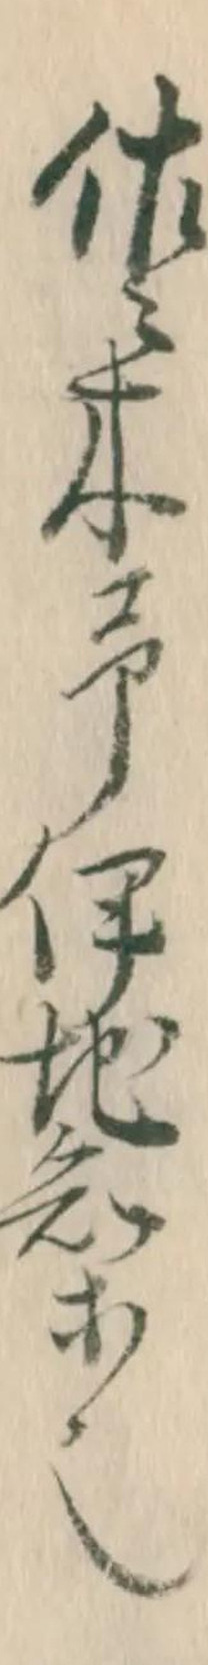佐々木予伊地知等也
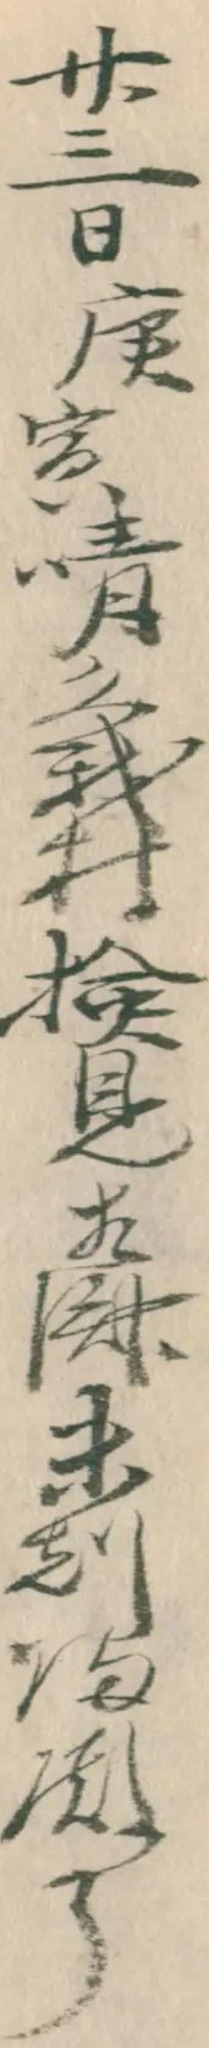廿三日庚寅晴久我村検見相済未刻帰殿了
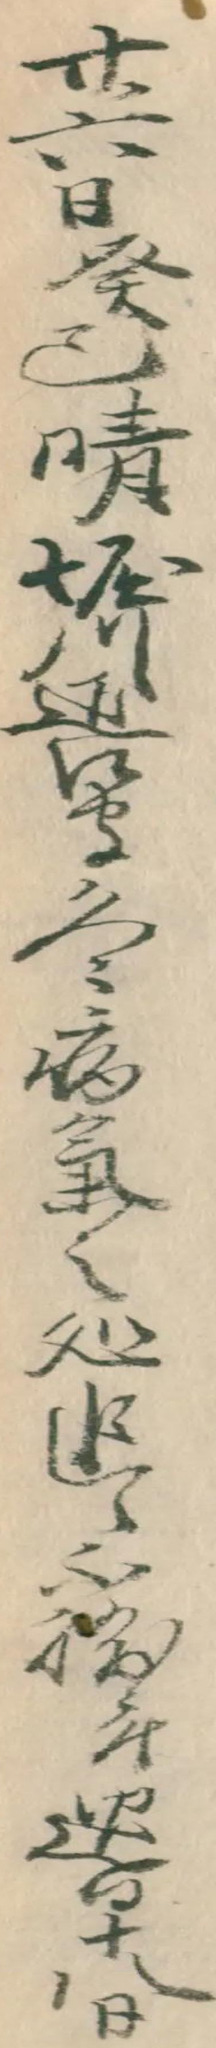廿六日癸巳晴堀川近江守久々病氣之処追々不勝ニ付過日十八日

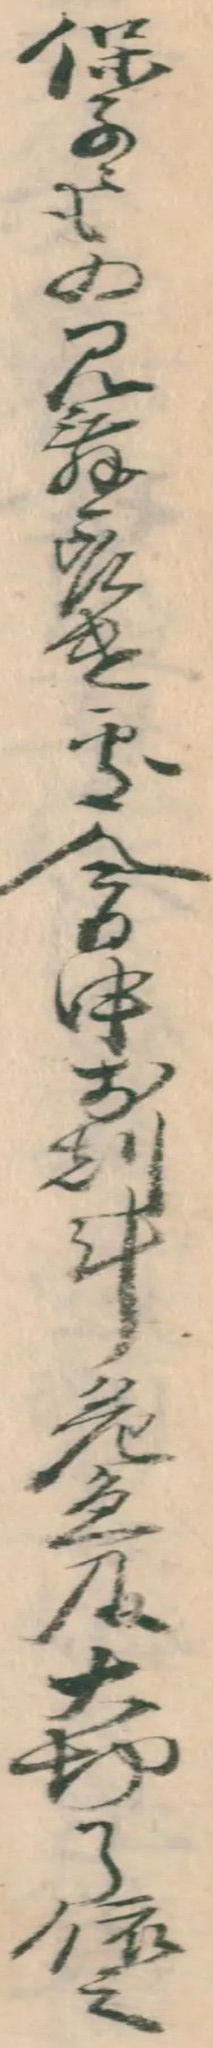保子ニも為見舞差遣處今日申別刻斗危急及大大切了依之
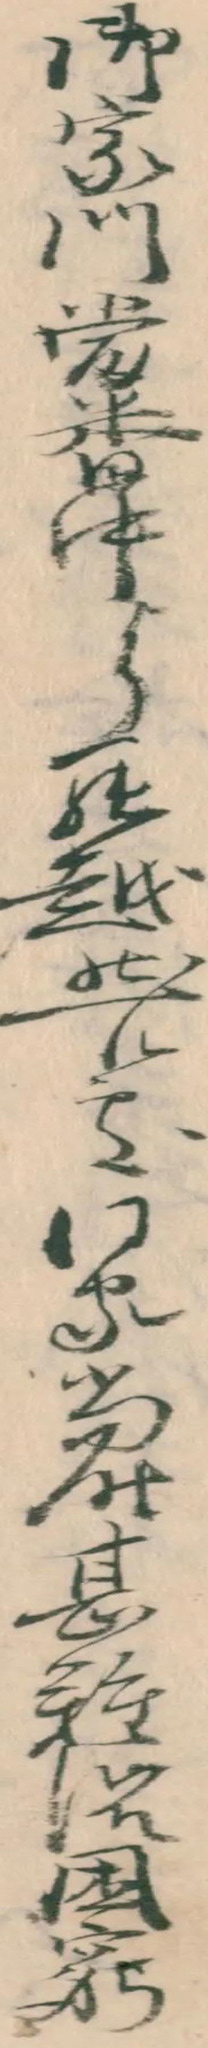御家門當番中より罷越然候處同家當時甚難渋困窮
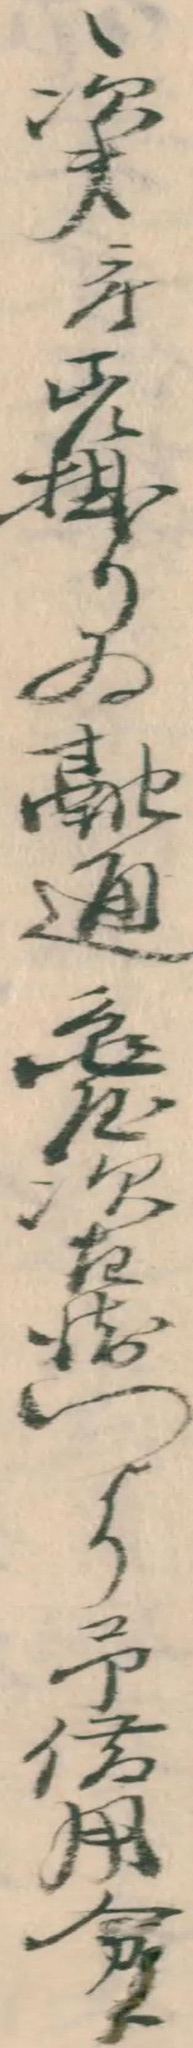之次第ニ付差掛り為融通亀屋次左衛門より予借用分
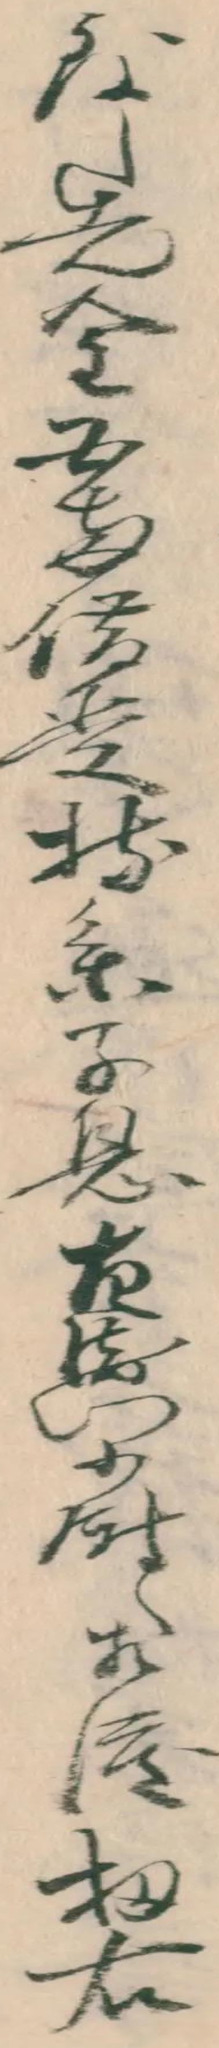致し先金五両借受持参子息左衛門少尉へ相渡扨右
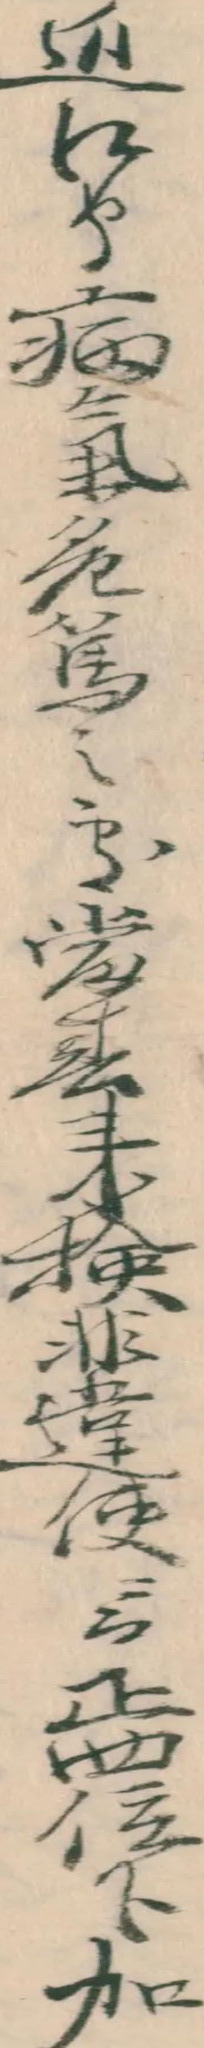近江守病氣危篤之處當春来検非違使ニ而正四位下加
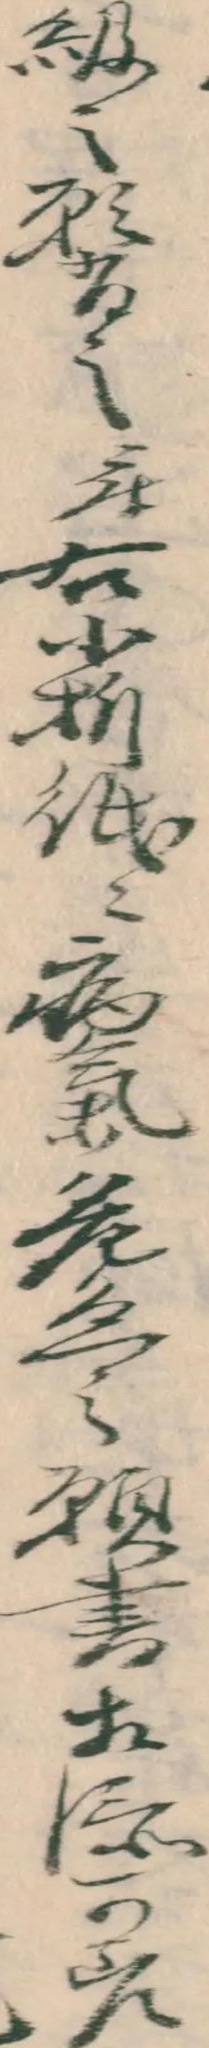級之願有之ニ付右小折紙ニ病氣危急之願書相添可差
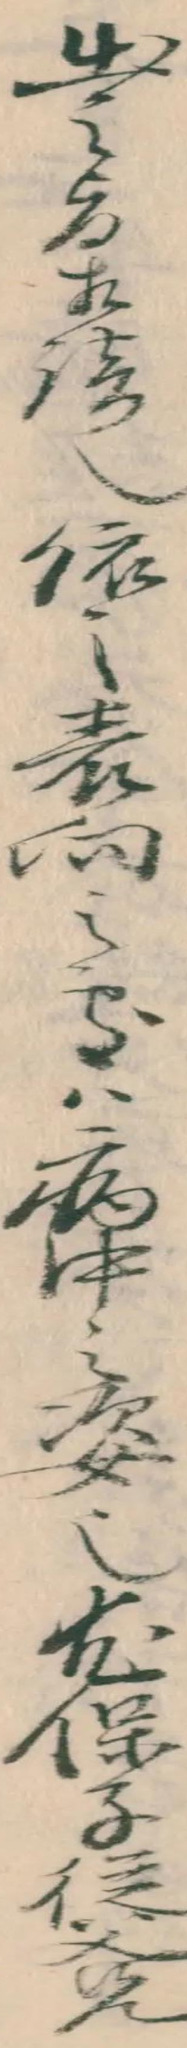出之旨相談也依之表向之處ハ病中之姿也尤保子従父兄
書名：賀茂社記録. 第66冊
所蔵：国立国会図書館 National Diet Library, JAPAN
